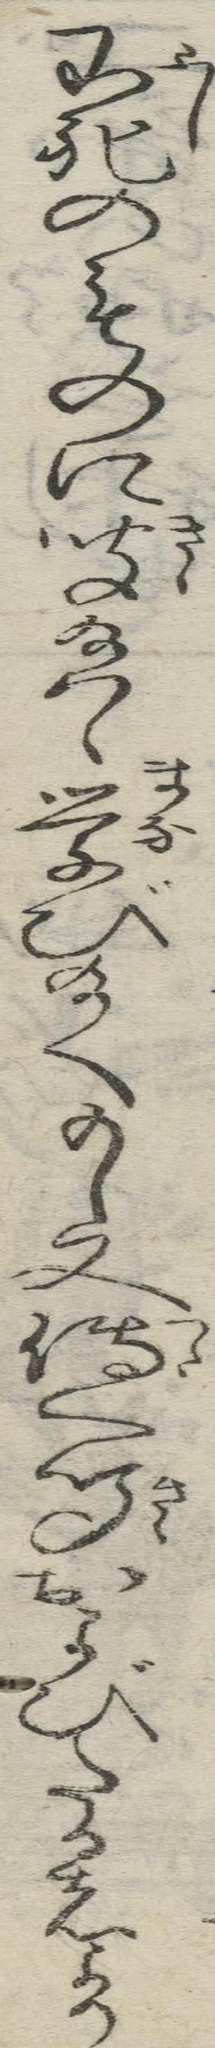不死のものに聞はなく学びはへもし又伝へ聞およびたる者より
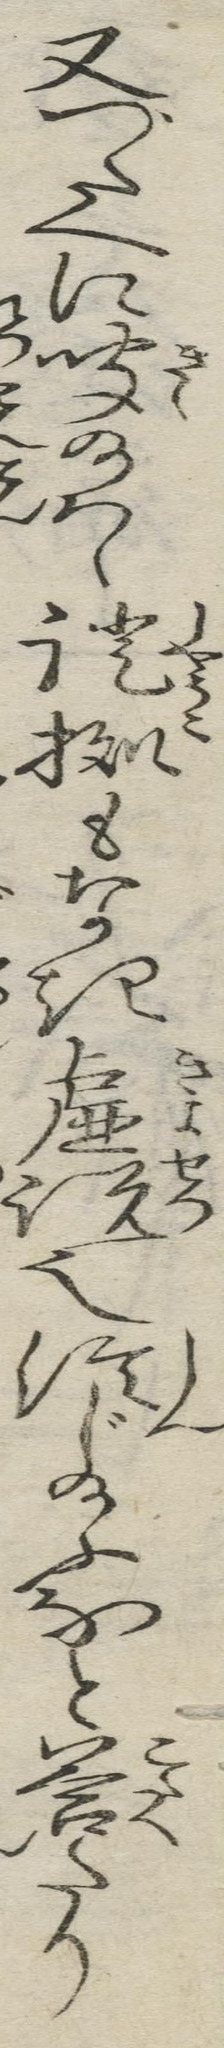又つたへに聞はなく証拠もなき虚説也信じはふなと答たり
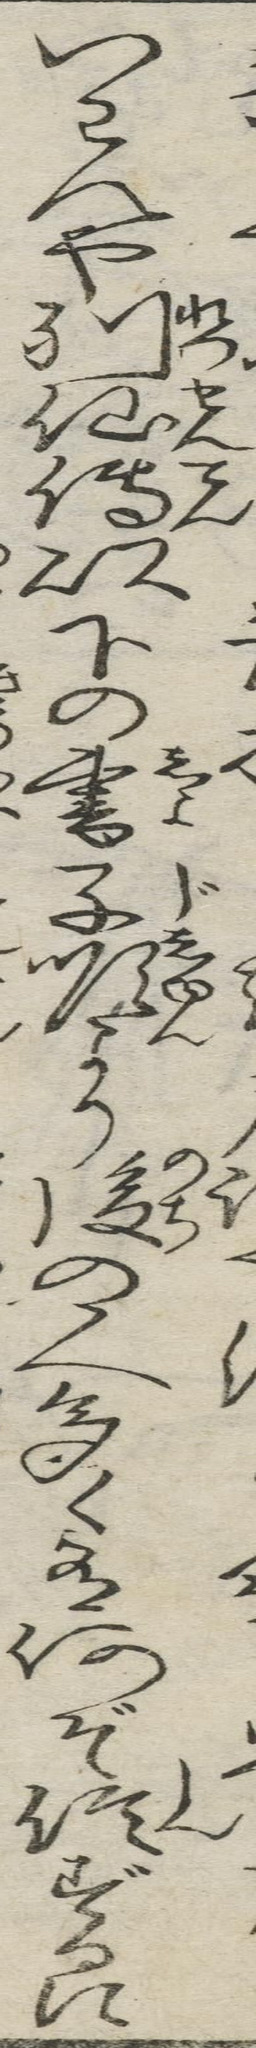いわんや列仙伝以下の書子順より後の人多く有何ぞ信ずるに
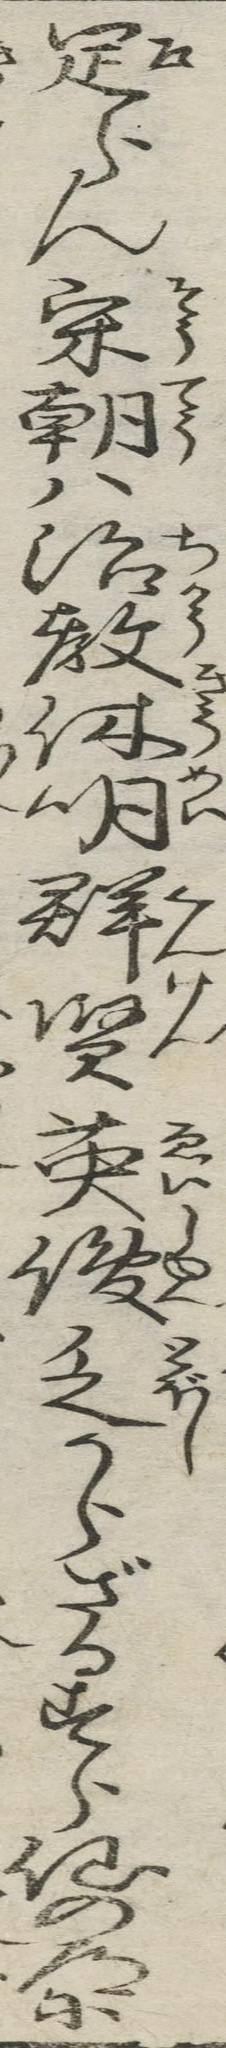足らん宋朝は治教休明群賢英俊乏ならざるすら仙の道に
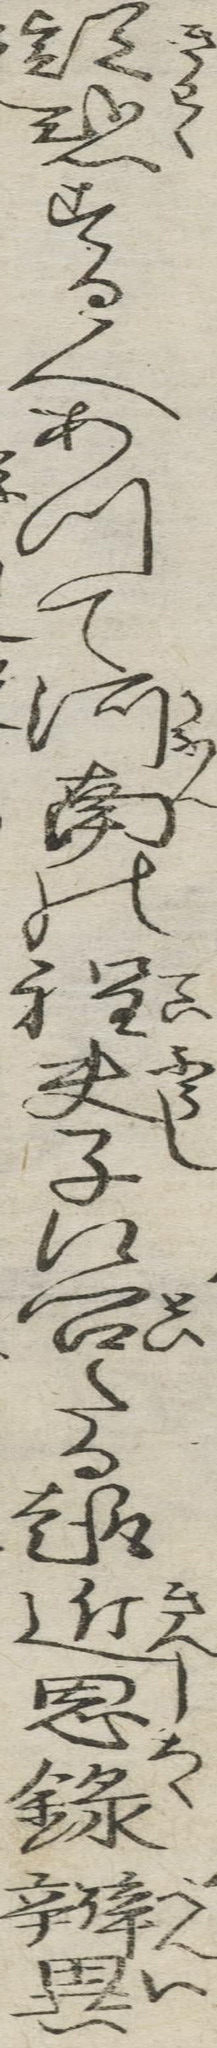起惑する人あつて河南の程夫子に問たる処近思録辨異
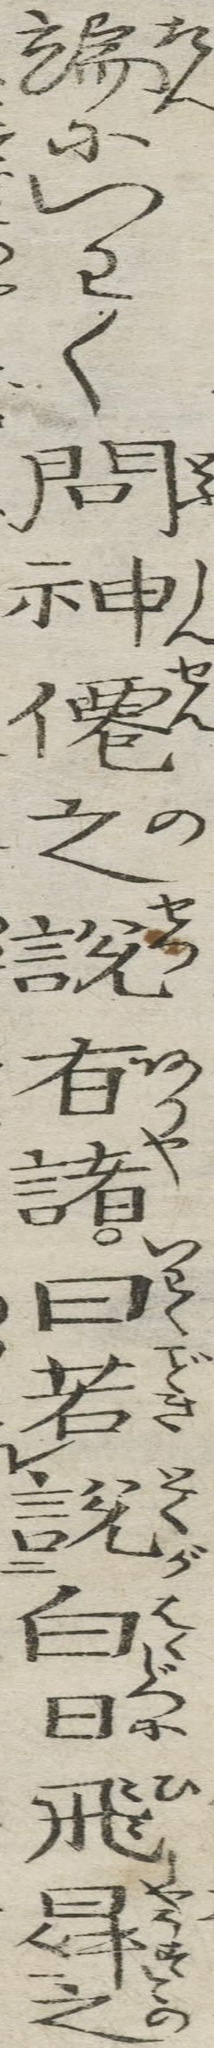端にいわく問神僊之説有諸。曰若説白日飛昇之
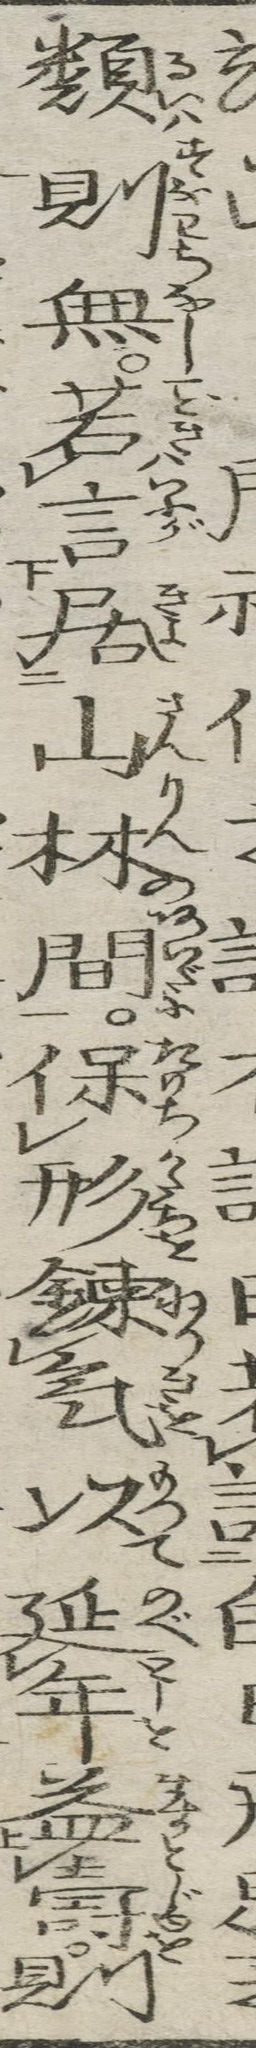類則無。若言居山林間。保形錬気以延年益壽。則
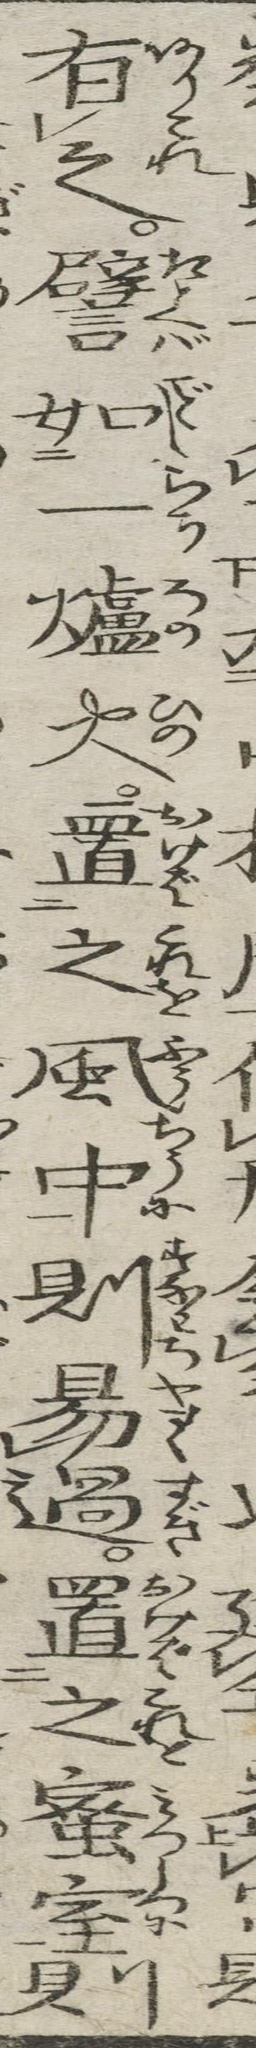有之。譬如一爐火。置之風中則易過。置之蜜室則
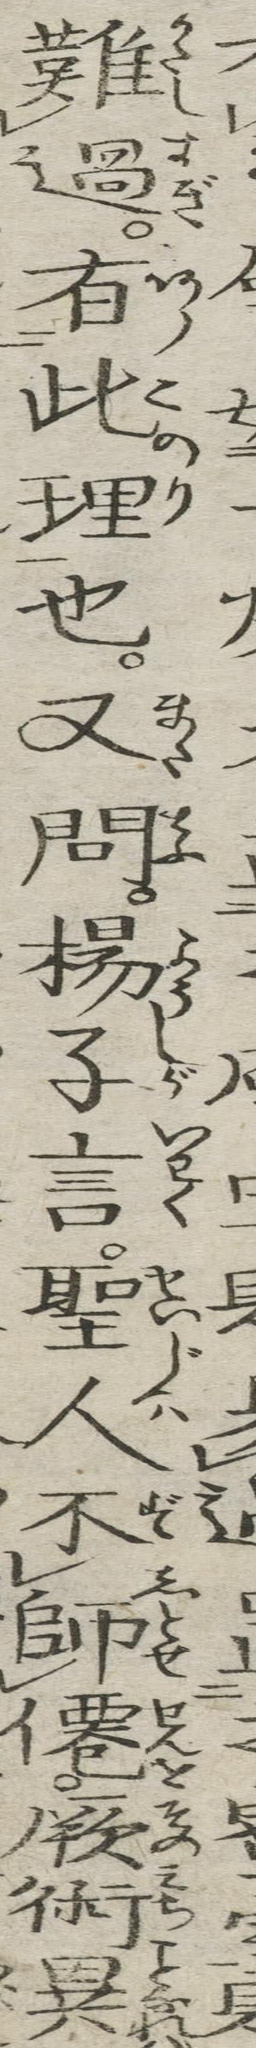難過。有此理也。又問。楊子言。聖人不師僊。厥術異
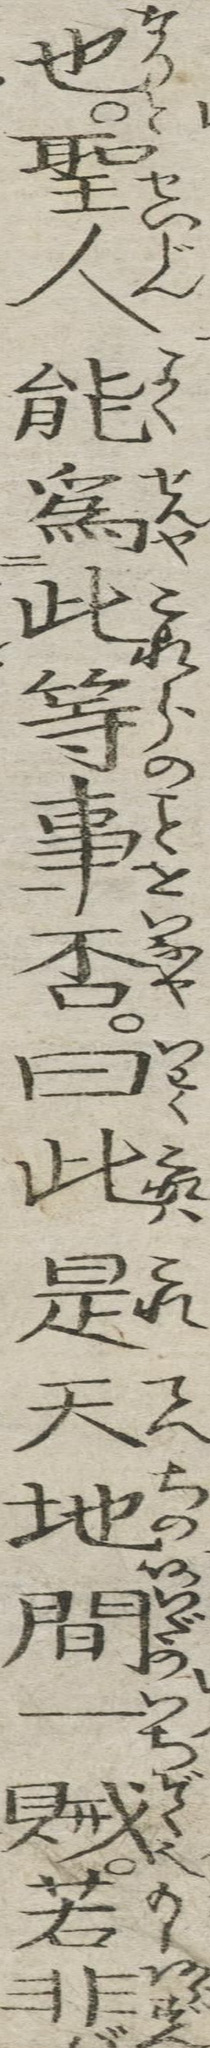也。聖人能為此等事否。曰此是天地間一賊。若非
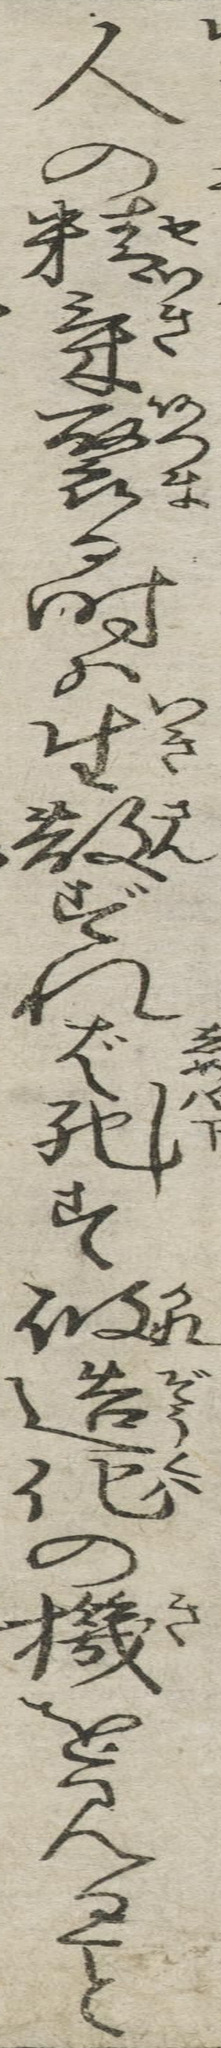人の精気聚る時は生散ずれば死す彼造化の機をよへること
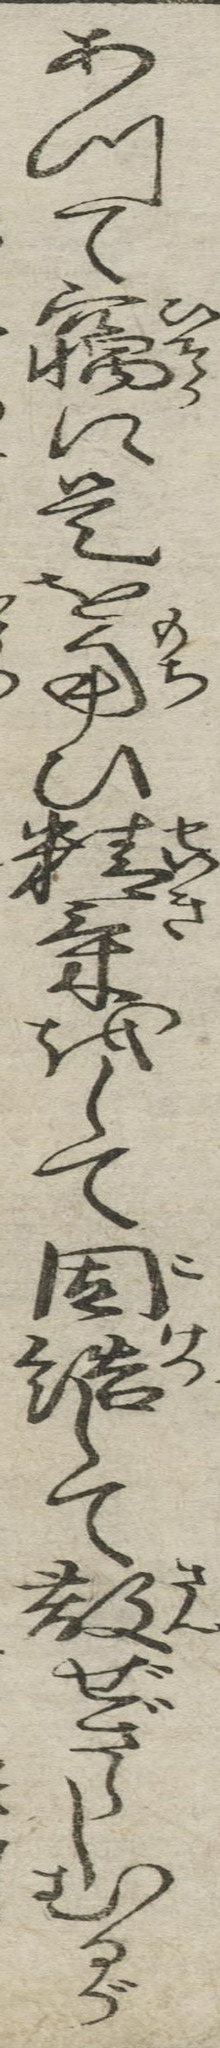あつて竊に是を用ひ精気をして固結して散ぜざらしむるが
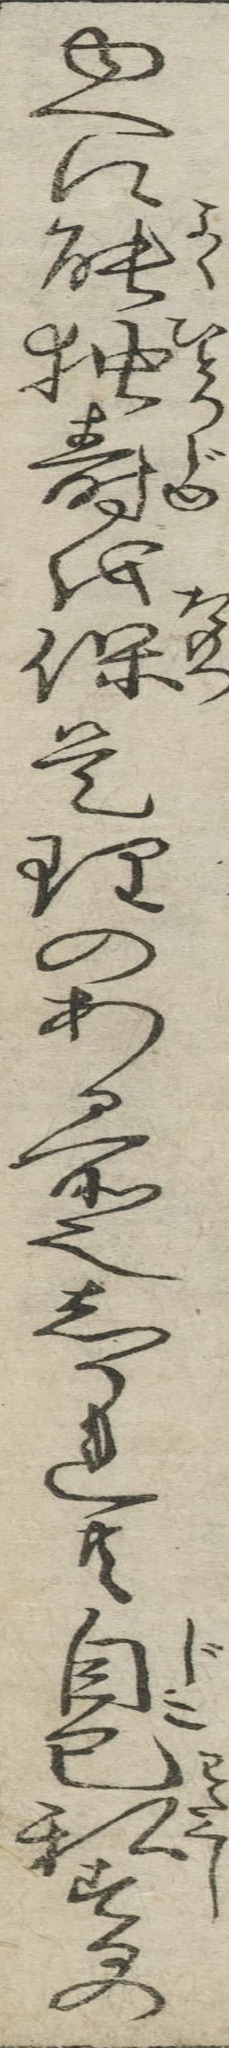ゆへに能独壽を保是理のある所也しかれども自己私するの

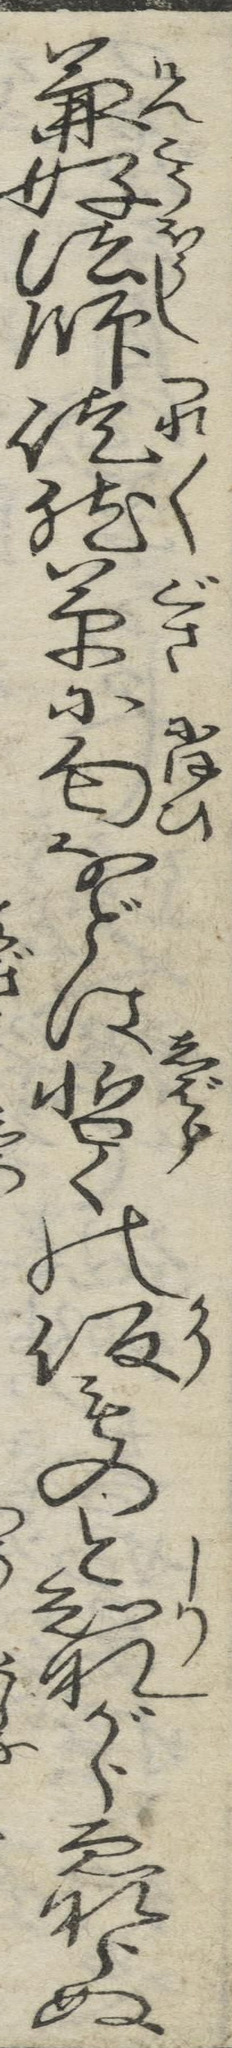兼好法師徒然草に匂などは暫くの仮ものと知ながら克ならぬ
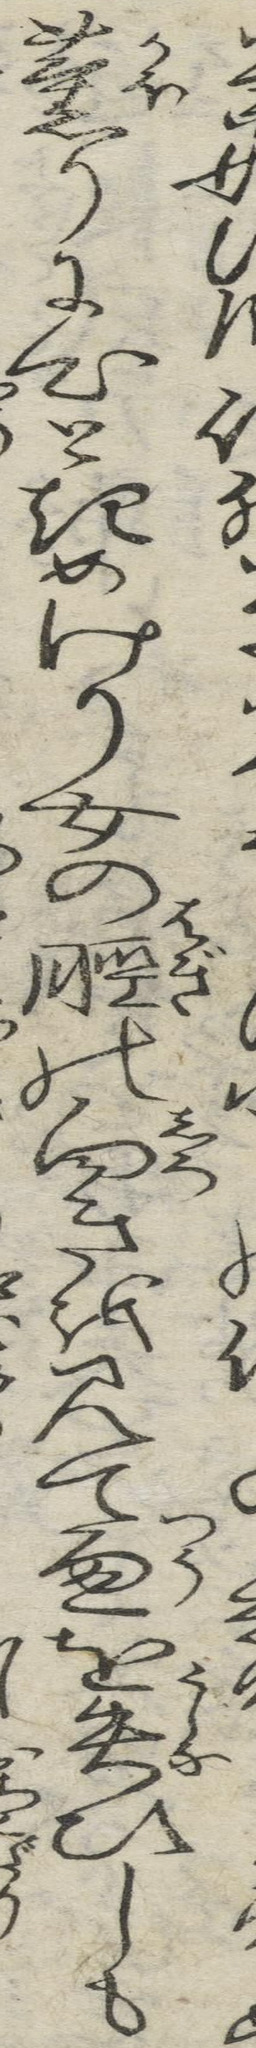薫りに心ときめけり女の脛の白きを見て通を失ひしも
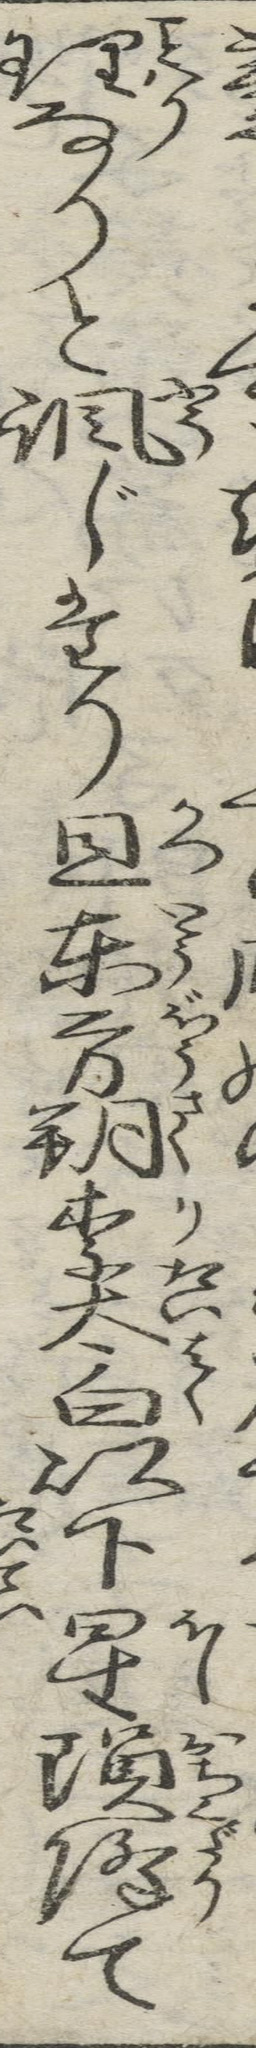理なりと調じたり且東方朔李太白以下星隕降て
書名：訓蒙天地辨　人
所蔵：東京大学地震研究所図書室 Earthquake Research Institute Library, The University of Tokyo, JAPAN
